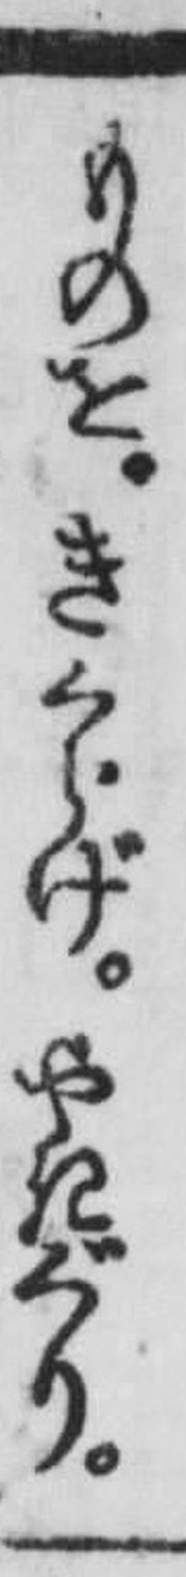ものを。きくらげ。やきぐり。
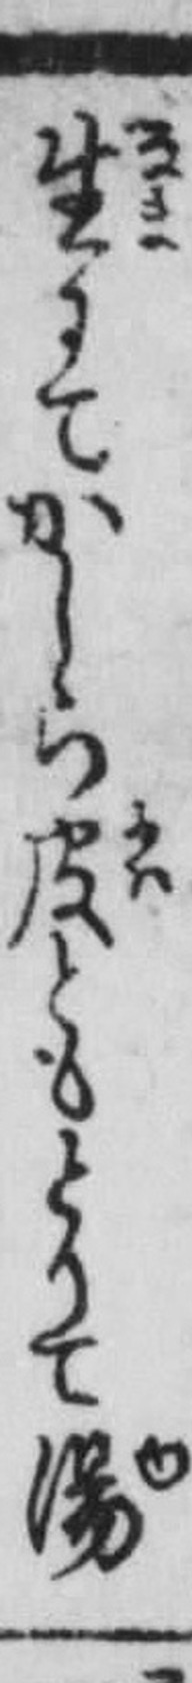生にてかしら皮ともとりて湯
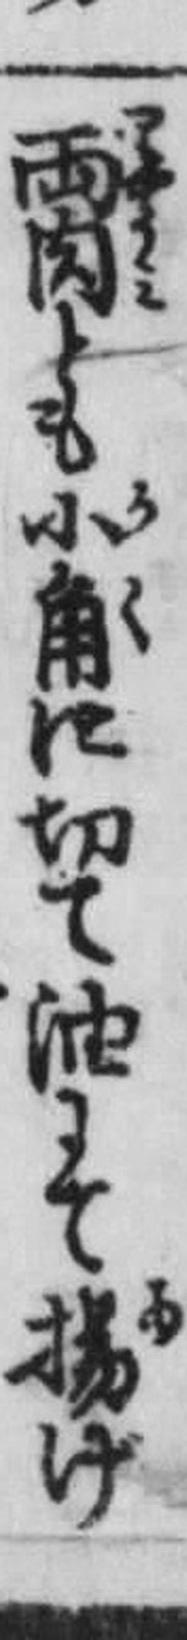両肉とも小角に切て油にて揚け
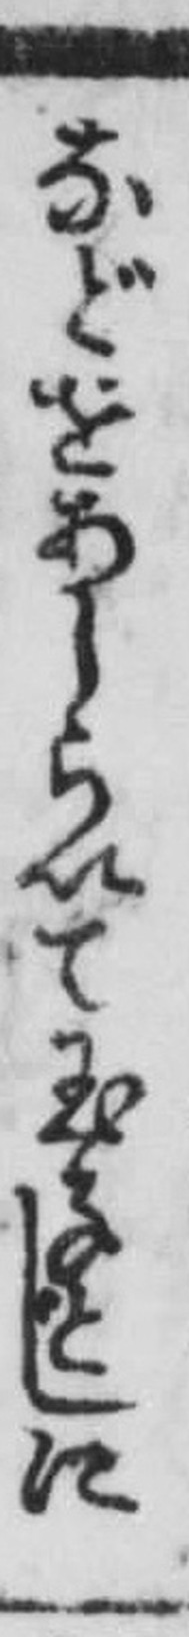などをあしらいて玉子とじに
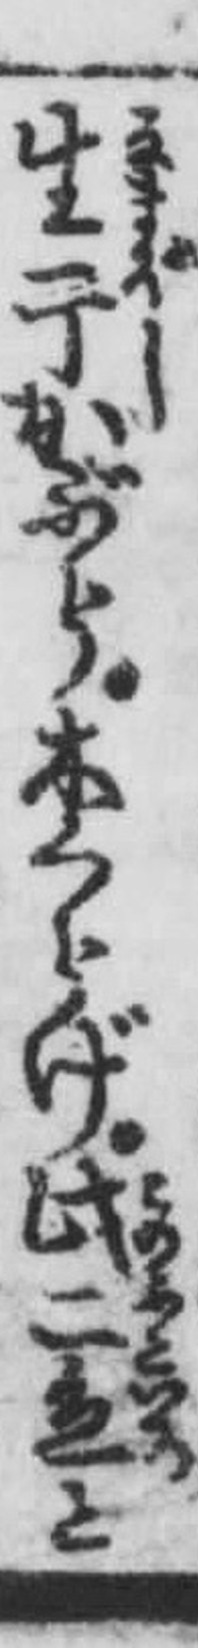生干かぶら木くらげ此二色を
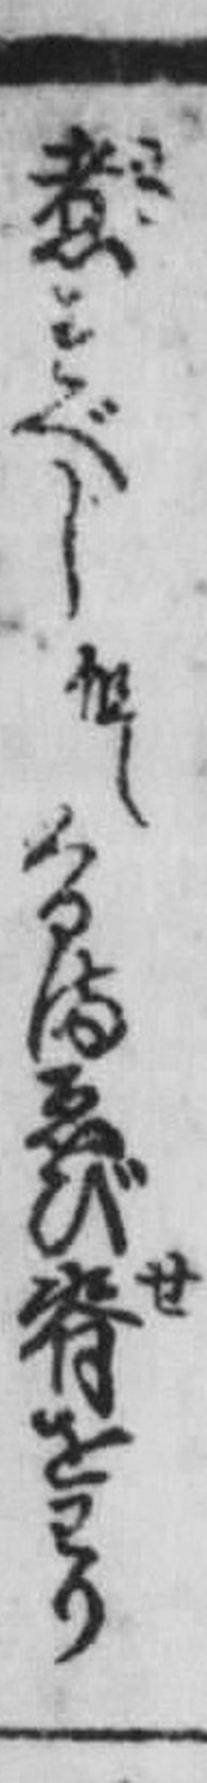煮すべし但しくるまゑび背をわり
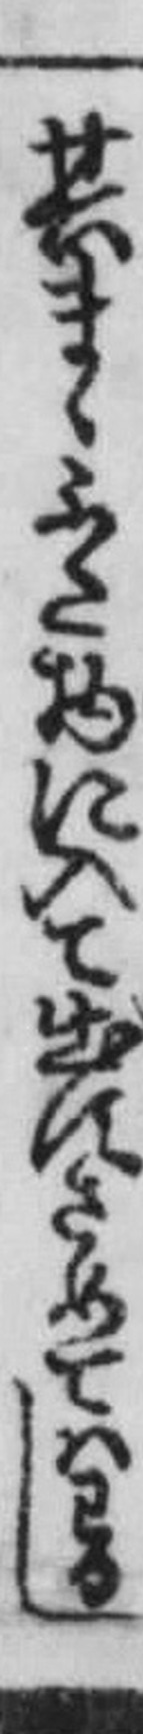其まゝふた物に入て出すさめてはわるし
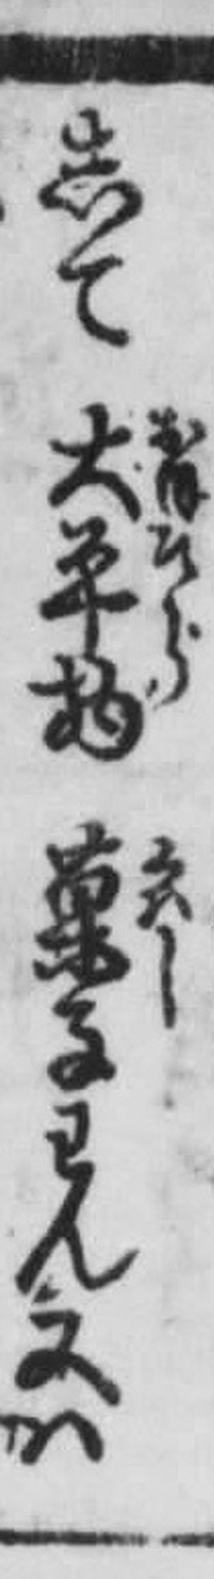して大平物菓子わん又は
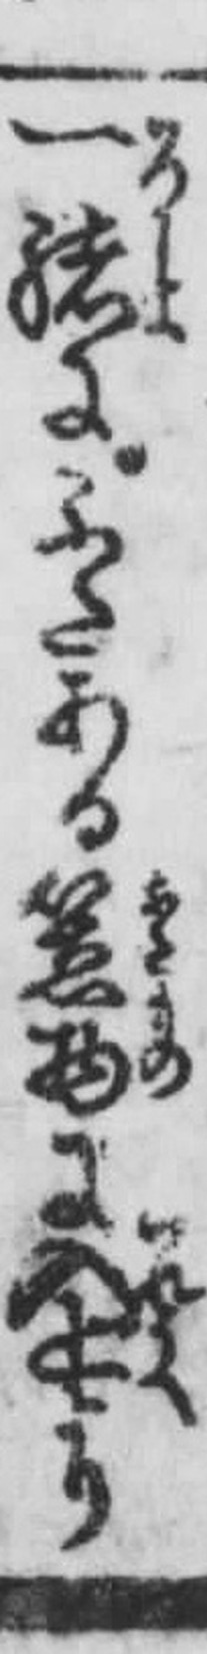一緒にふたある筥物に入上に
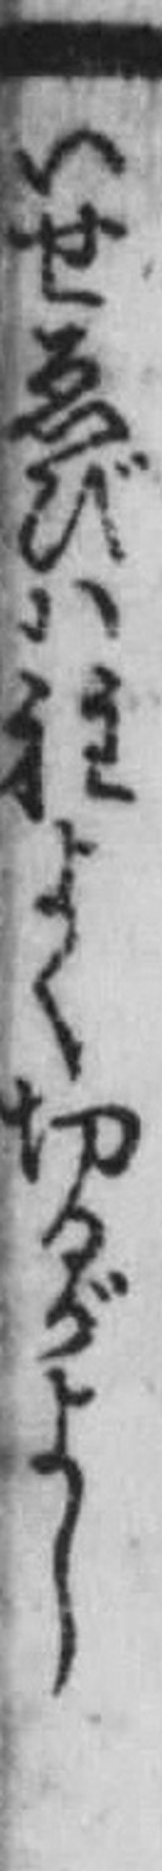いせゑびは程よく切るがよし
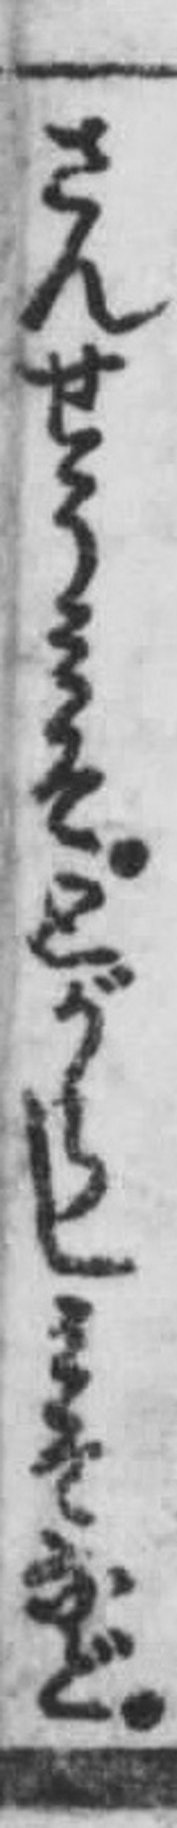さんせうみそとがらしみそなど
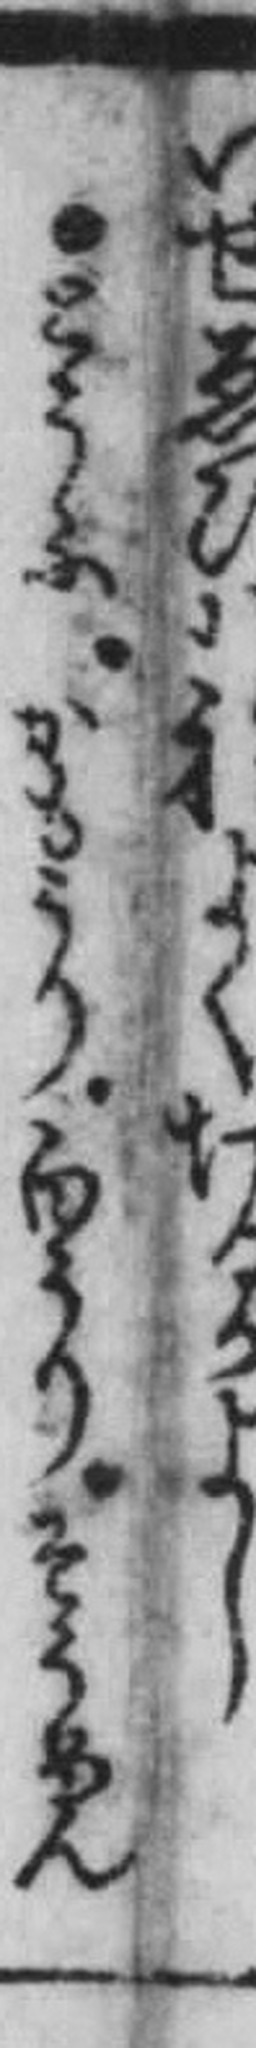●とうふ。かもうり。白うり。そうめん
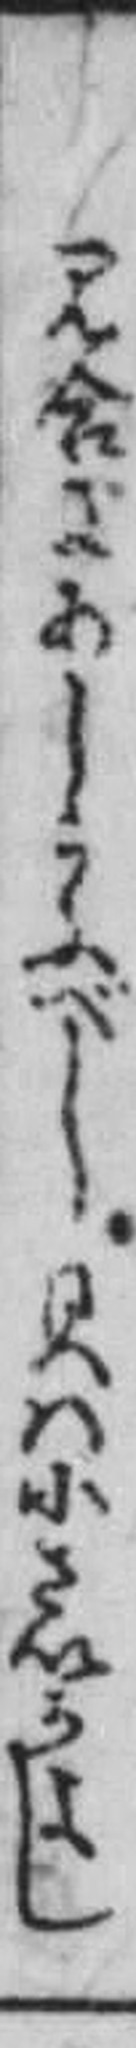見合にあしらふべし。貝は小さいかよし
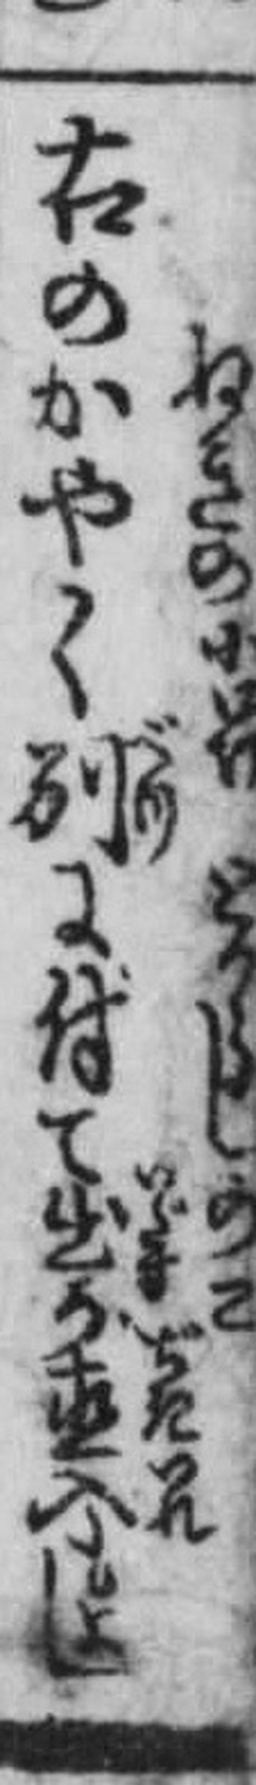右のかやく別に付て出か直入もよし
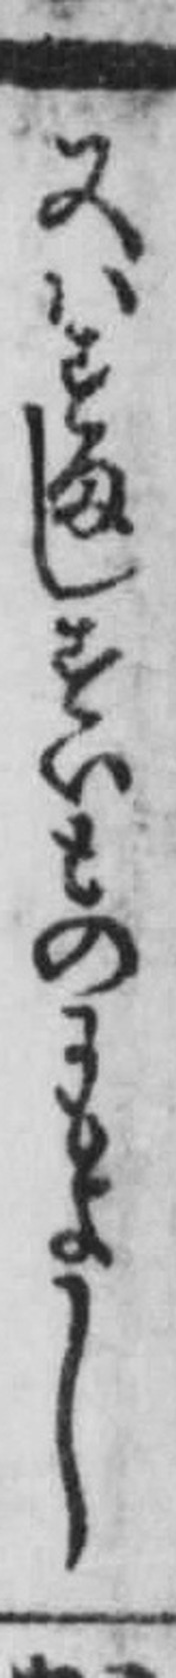又はすましすしすいものにもよし
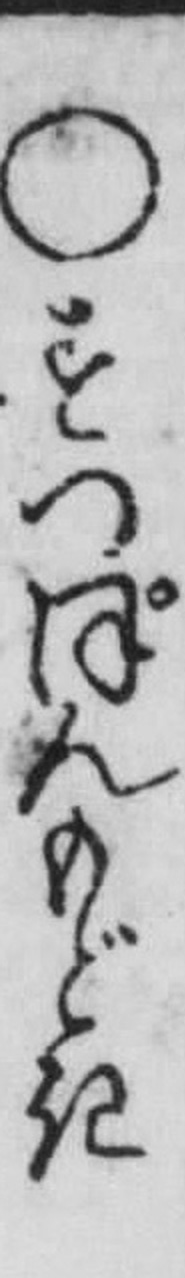○すつぽんもどき
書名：精進魚類間合料理/早速庖丁
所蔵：大阪府立大学学術情報センター 国文学研究資料館
